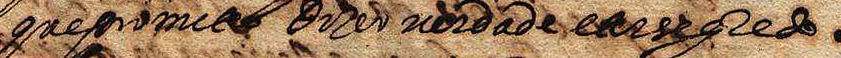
que prometeo dizer uerdade e ter segredo.
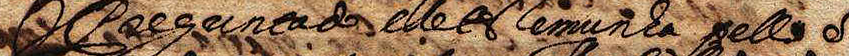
Preguntado elle testemunha pello ꝯ
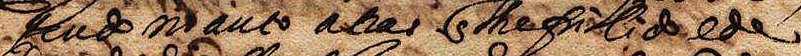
teudo no auto atras q̄ lhe foi lido e de
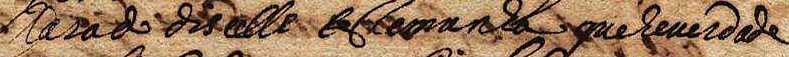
Clarado dis elle testemunha que he uerdade
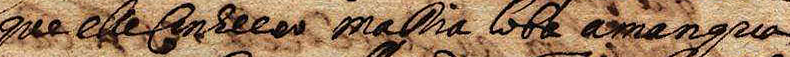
que elle Conheceo maRia loba a manqua
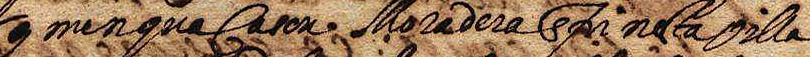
q̄ nunqua Casou. Moradora q̄ foi nesta villa
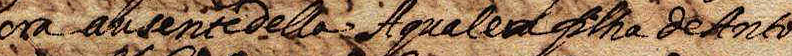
ora ausente della. A qual era filha de Anto
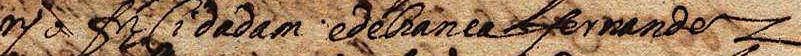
njo frz̄ Cidadam e de branca fernandez
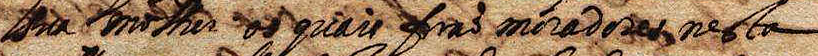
sua molher os quais foraõ moradores nesta
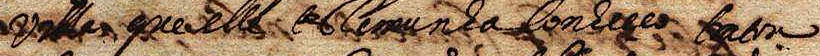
villa que elle testemunha Conheceo tratou
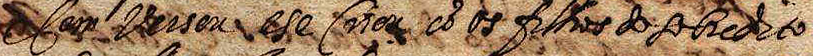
e ComVersou e se Criou cō os filhos do sobredito
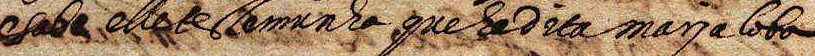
e sabe elle testemunha que ha dita marja loba
